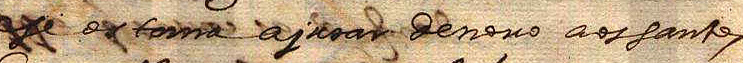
e se os torna a jurar de nouo aos santos
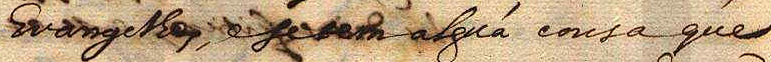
Euangelhos, e se tem alguā cousa que
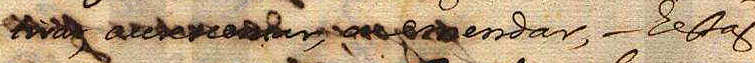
tirar, acrescentar, ou emendar, – E estas
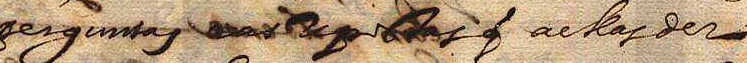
perguntas e as Repostas q̄ a ellas der
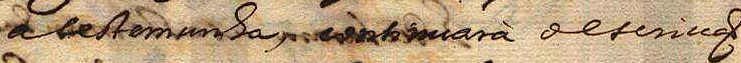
a testemunha, continuarà o escriuaõ
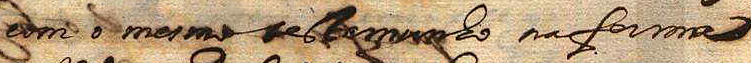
com o mesmo testemunho na forma
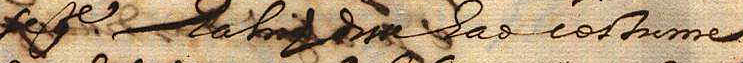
segte. E al não disse E ao costume
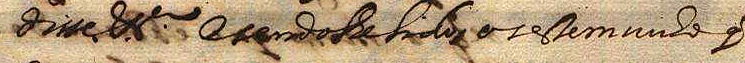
disse &.a e sendolhee lido o testemunho q̄
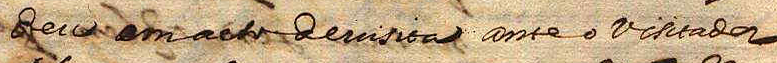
deu em acto de uisita ante o visitador
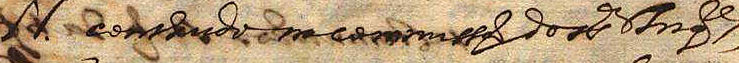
N. contheudo na comissaõ dos srs Inqres,
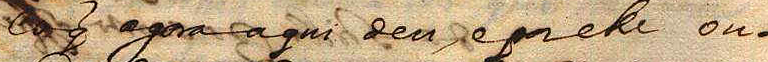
e o q̄ agora aqui deu, e por elle ou
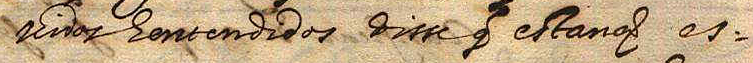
uidos E entendidos disse q̄ estauaõ es
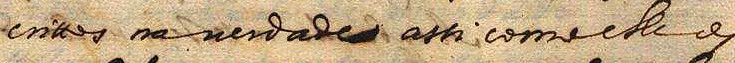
crittos na uerdade assi como elle os
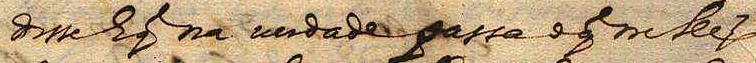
disse E q̄ na uerdade passa o q̄ nelles
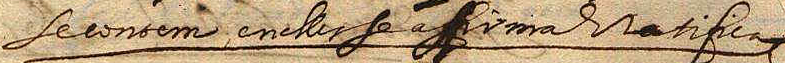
se contem, e nelles se affirma E Ratifica
